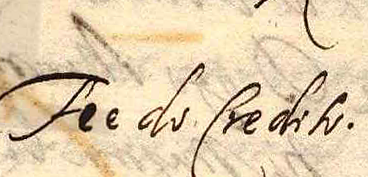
Fee do Credito.
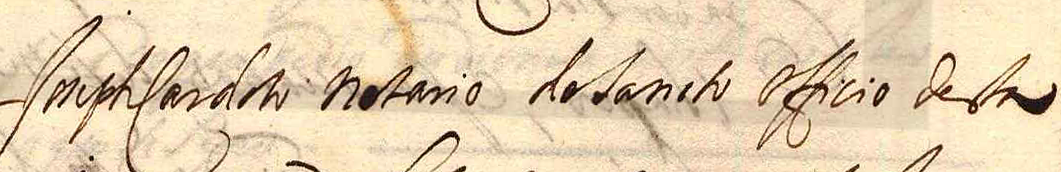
Joseph Cardoso notario do Sancto Officio desta
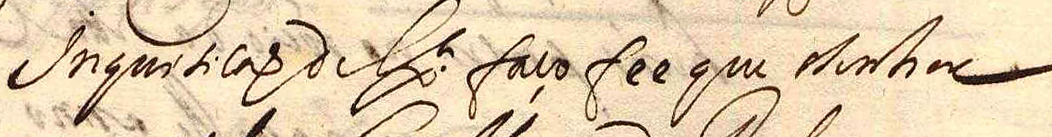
Inquisiçaõ de Lx.a faço fee que o senhor
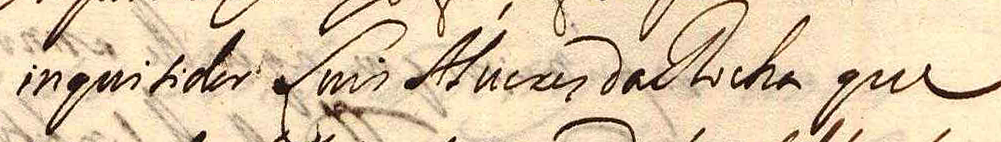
inquisidor Luis Alueres da Rocha que
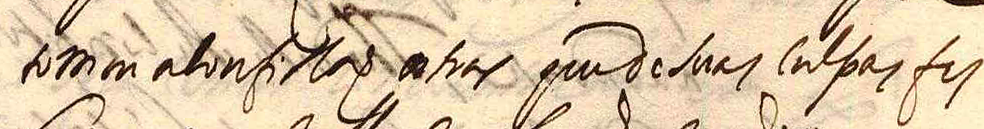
tomou a confissaõ atras que de suas culpas fez
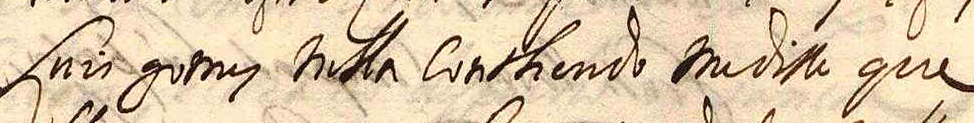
Luis gomes nella contheudo me disse que
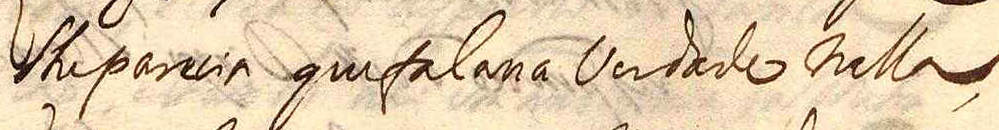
lhe parecia que falaua verdade nella,
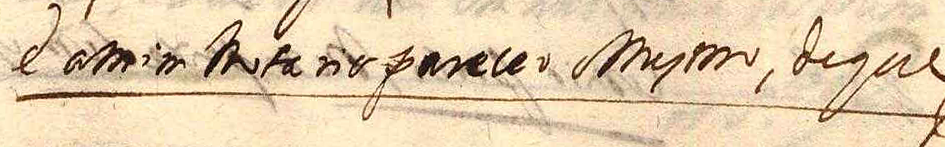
e a mim Notario pareceo o mesmo, de que
